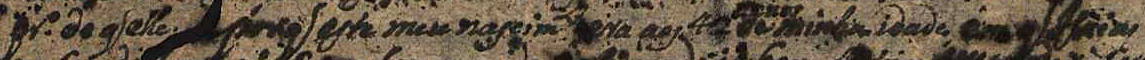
pr.o do q̄ elle _ porq̄ este meu nascim.to era aos 42 annos de minha idade em q̄ Isaias
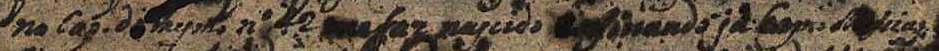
no Cap. do mesmo n.o 42 me faz nascido e asinando ja _ M_ssias
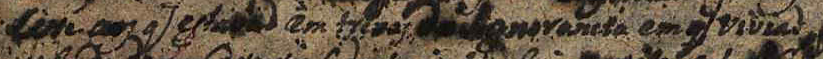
cere aos q̄ estavaõ em trevas da Ignorancia em q̄ viviaõ
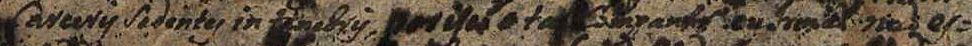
Carceres sedentes in tenebris, por isso o ta_ Companhr.o ou Irmaõ naõ es
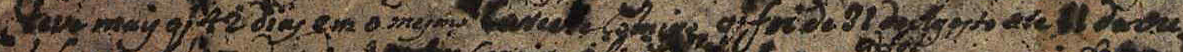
teve mais q̄ 42 dias em o mesmo Carcare Comigo, q̄ foi de 31 de Agosto o de 41 de ou
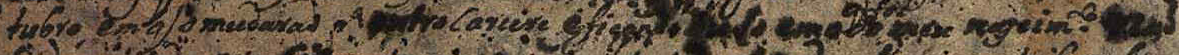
tubro, em q̄ o mudaraõ p.a outro Carcere e ficando tudo em o d.o meu nascim.to naõ
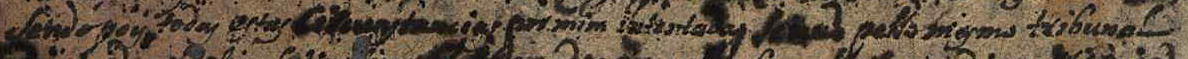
sendo pois todas estas Circunstancias por mim intentadas senaõ pello mesmo tribunal
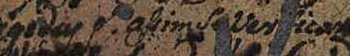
_godas p.a assim se ver_ficar
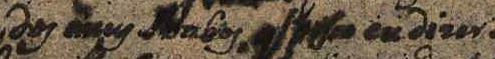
dos mais _abios, q̄ posso eu dizer
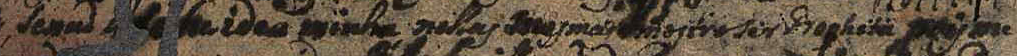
,senaõ _duzidas minha nellas mesmas e mostro ser Propheta mais me
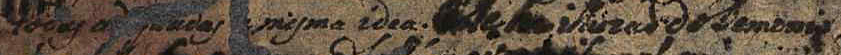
todas adequadas _ misma idea. E se he illuzaõ do Demonio
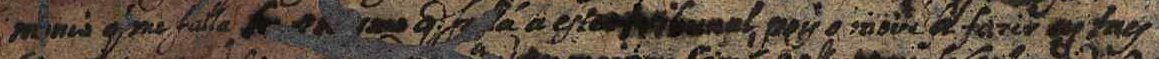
monio q̄ me falla he o m_smo q̄ fa_la a este Tribunal, pois o move a fazer as taes
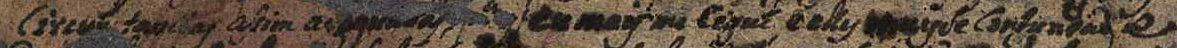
Circunstancias asim a_guradas p.a q̄ eu mesmo Cegue, e elles mais se Confundaõ, e
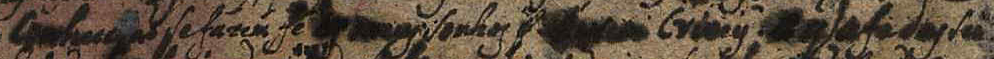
Conhece__ se fazem fe os mais sonhos p. ___ Criaeis; e q̄ a fe das scr
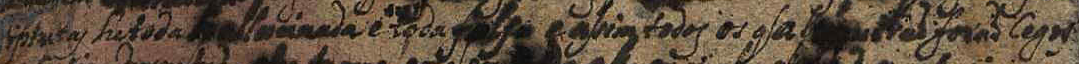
ipturas he toda hallucinada e toda falsa e assim todos os q̄ a b__eraõ foraõ Cegos
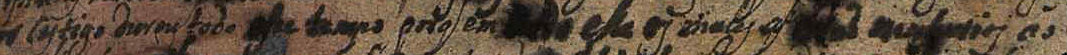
os Castigo durou todo este tempo porq̄ em _odo esse os males q̄ _aõ necessarios ao
